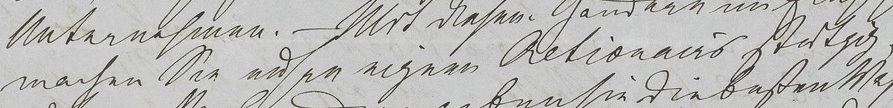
machen Sie unsre eignen Actionairs stutzig,
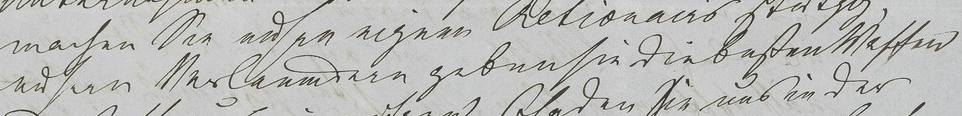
unsern Verläumdern geben sie die besten Waffen
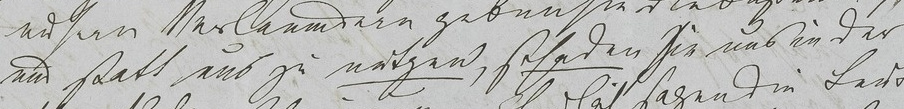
und statt uns zu nützen, schaden Sie uns in der
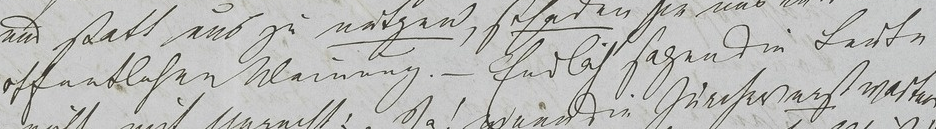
öffentlichen Meinung. – Endlich sagen die Leute
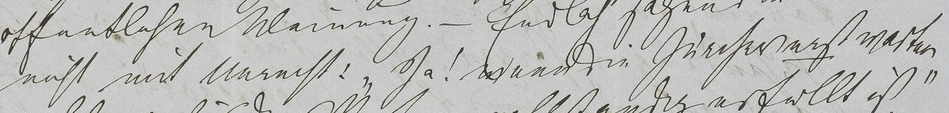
nicht mit Unrecht: «Ja! wenn die Zürchererst warten
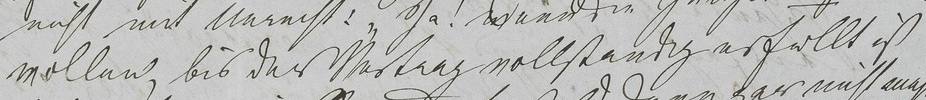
wollen, bis der Vertrag vollständig erfüllt ist
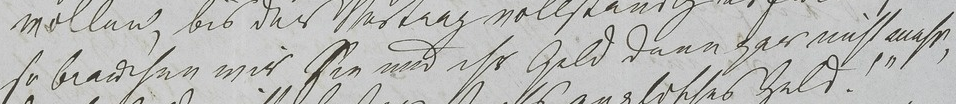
so brauchen wir sie und ihr Geld dann gar nicht mehr,
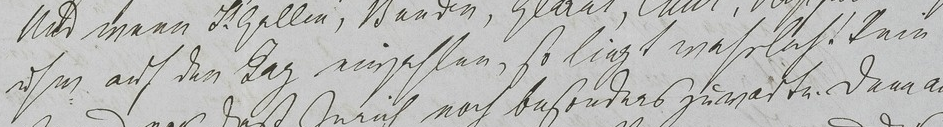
usw auf den Tag einzahlen, so liegt wahrlich! kein
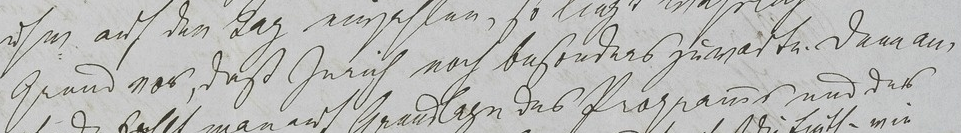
Grund vor, daß Zürich noch besonders zuwarte. Denn am
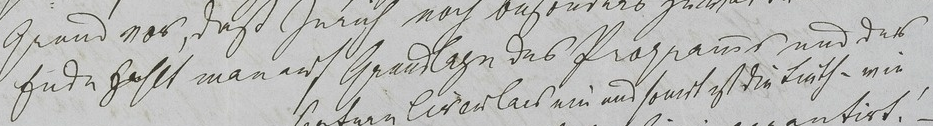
Ende zahlt man auf Grundlage des Programms und des
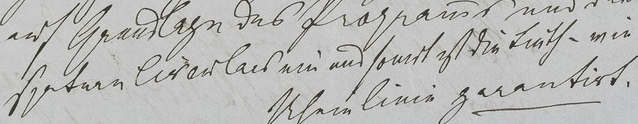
spätern Circulars ein und somit ist die Linth- wie
